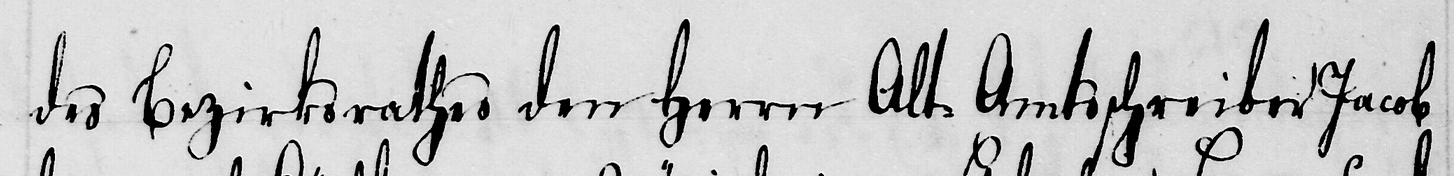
des Bezirksrathes den Herrn Alt-Amtsschreiber Jacob
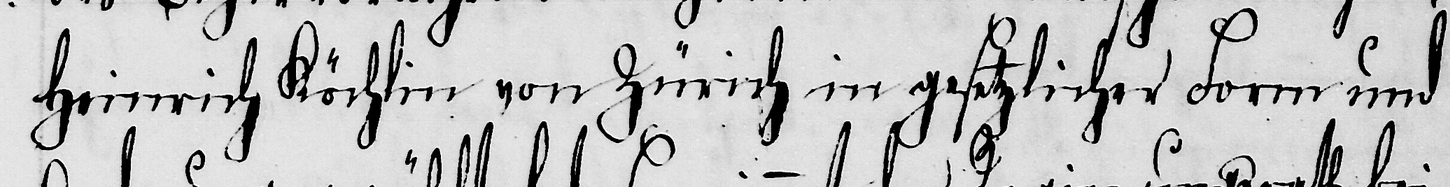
Heinrich Köchlin von Zürich in gesetzlicher Form und
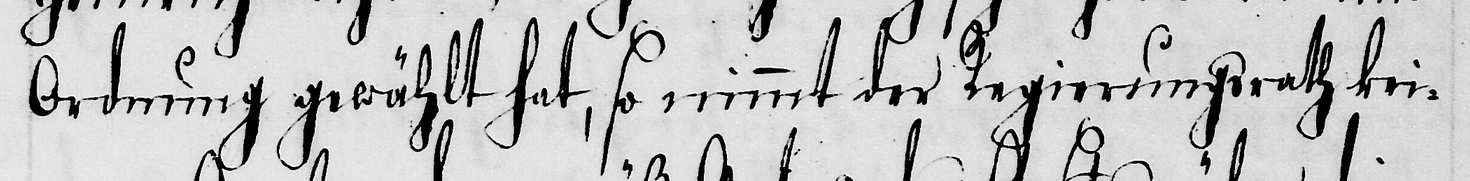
Ordnung gewählt hat, so nimmt der Regierungsrath kei¬
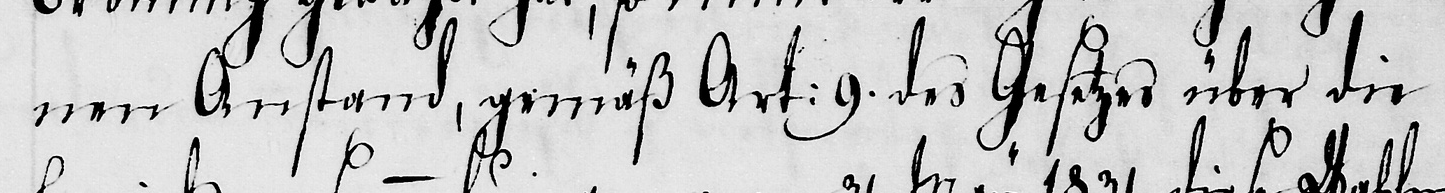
nen Anstand, gemäß Art: 9. des Gesetzes über die
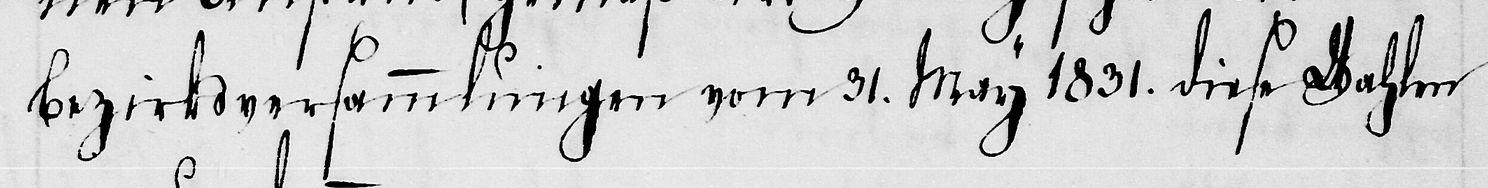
Bezirksversammlungen vom 31. May 1831. diese Wahlen
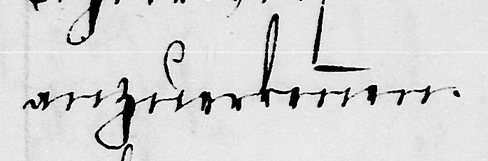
anzuerkennen.
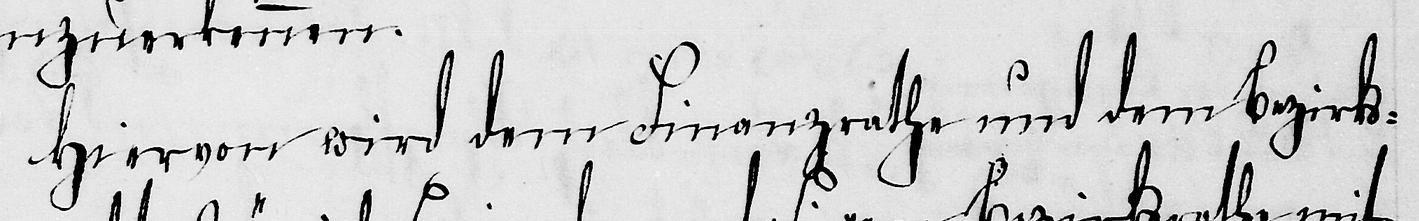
Hiervon wird dem Finanzrathe und dem Bezirks¬
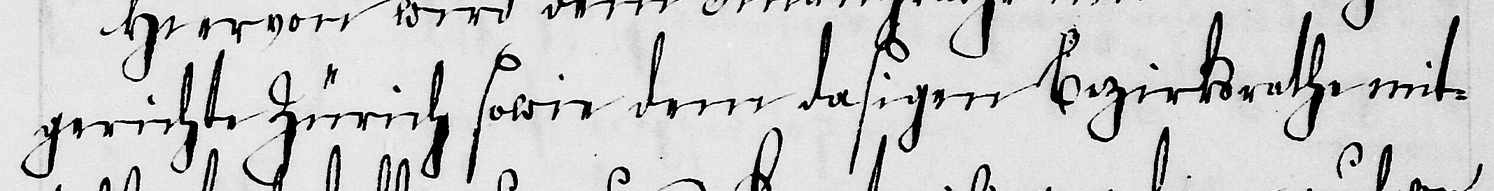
gerichte Zürich sowie dem dasigen Bezirksrathe mit¬
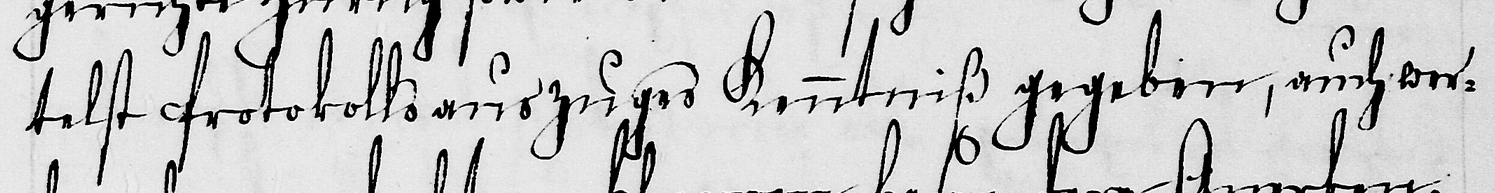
telst Protokollsauszuges Kenntniß gegeben, auch wer¬
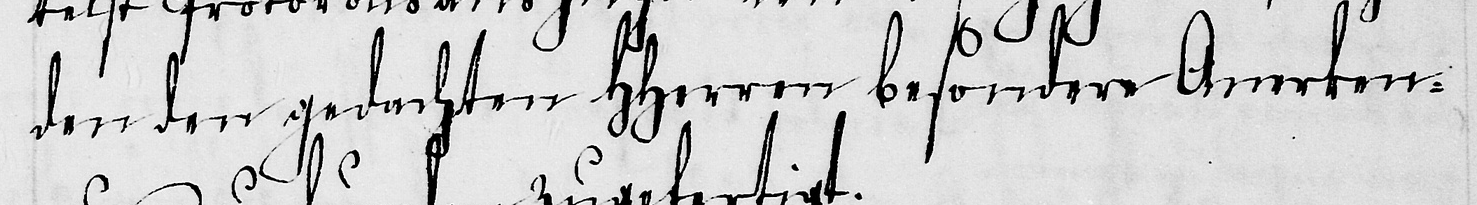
den den gedachten HHerren besondere Anerken¬
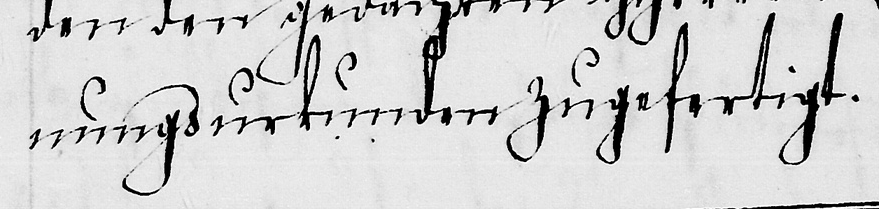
nungsurkunden zugefertigt.
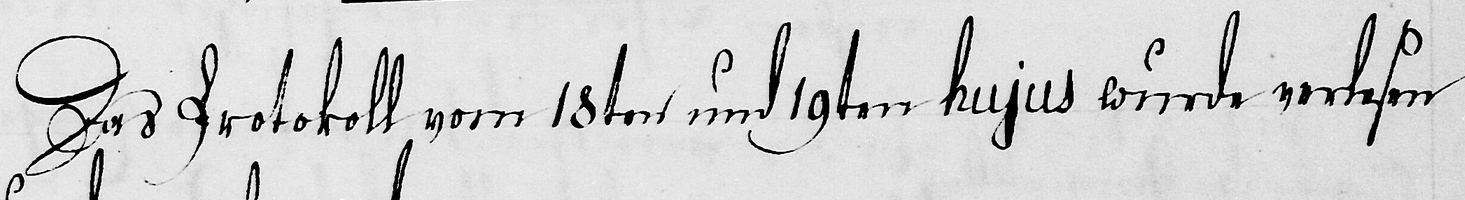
Das Protokoll vom 18ten und 19ten hujus wurde verlesen
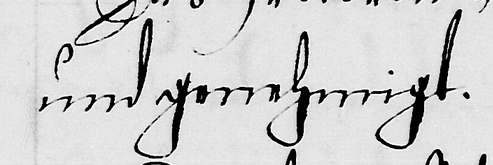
und genehmigt.
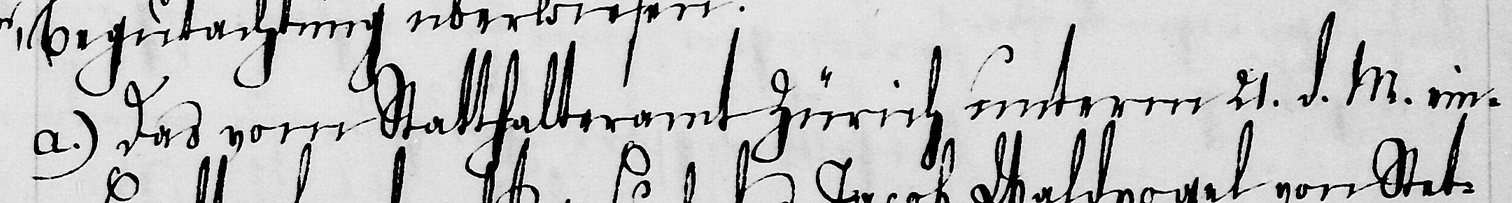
a.) Das vom Statthalteramt Zürich unterm 21. d. M. ein¬
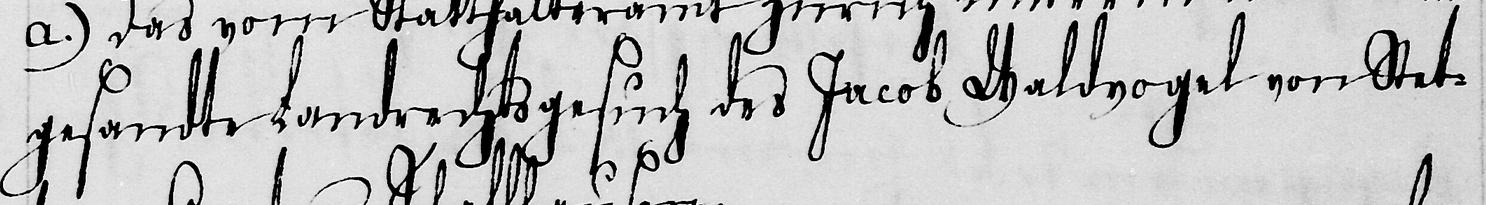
gesandte Landrechtsgesuch des Jacob Waldvogel von Stet¬
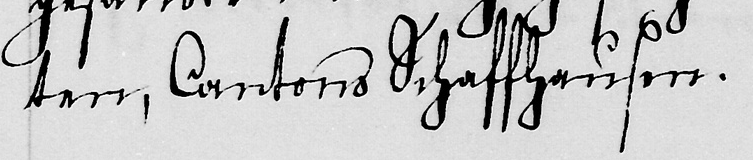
ten, Cantons Schaffhausen.
